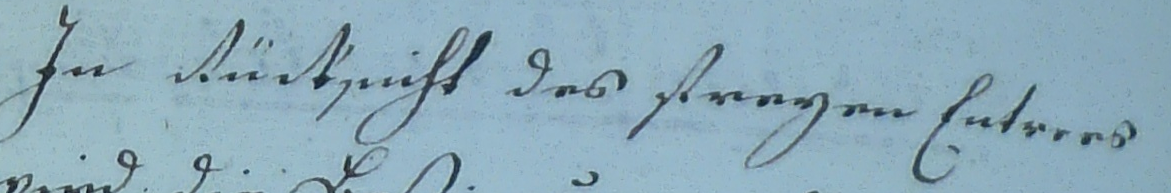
In Rücksicht des freyen Entrees
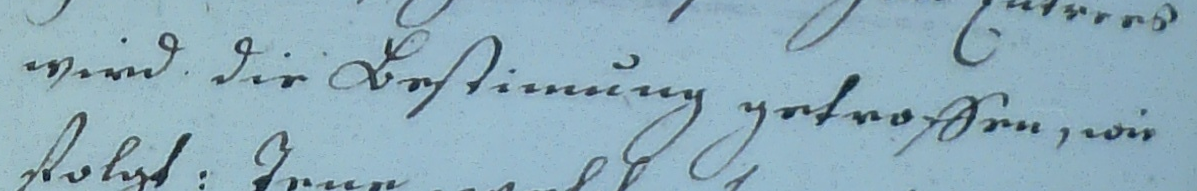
wird die Bestimung getroffen, wie
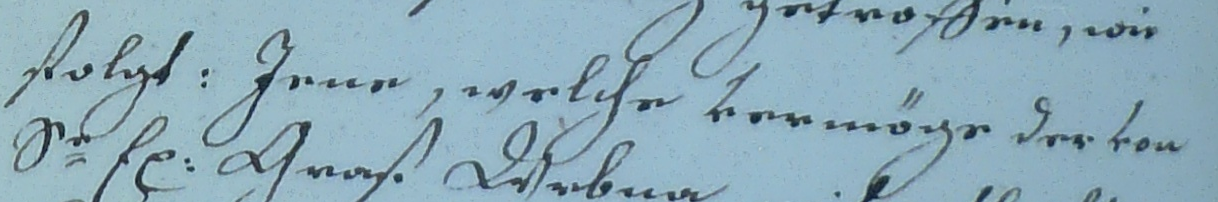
folgt: Jene, welche vermöge der von
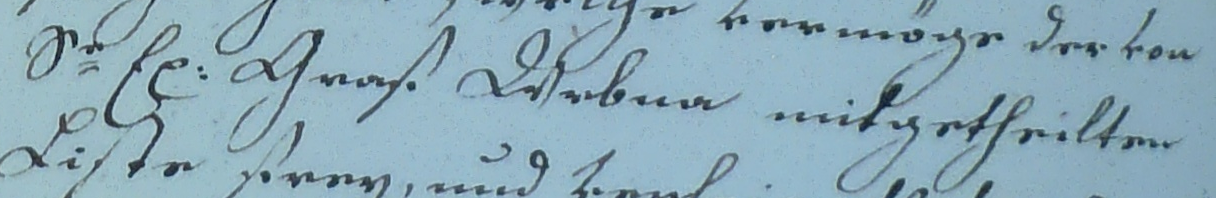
Se͇ Ex: Graf Wrbna mitgetheilten
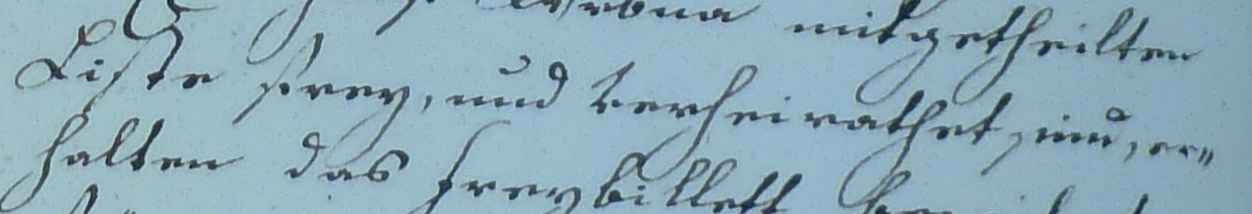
Liste frey, und verheirathet, und er¬
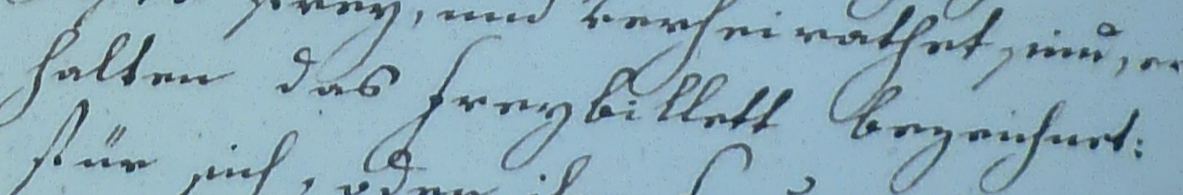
halten das Freybillett bezeichnet:
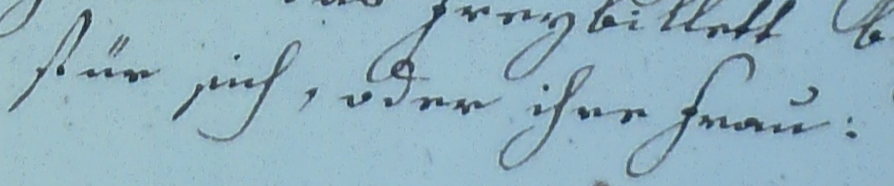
für sich, oder ihre Frau:
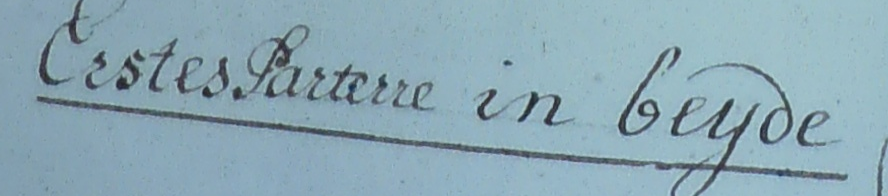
Erstes Parterre in beyde
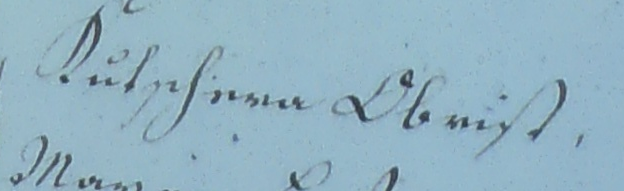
Kutschera Obrist,
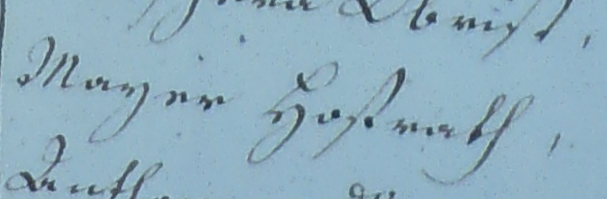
Mayer Hofrath,
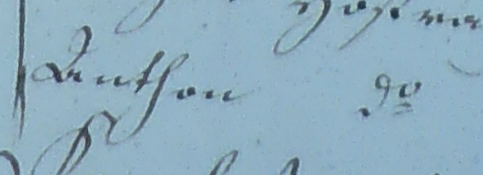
Anthon Do͇
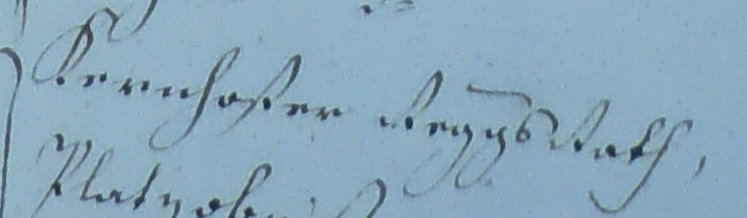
Kernhofer Reg͞gsRath,
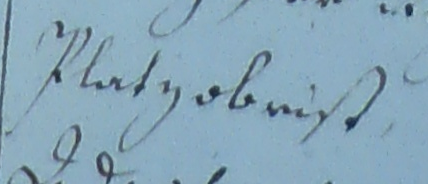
Platzobrist,
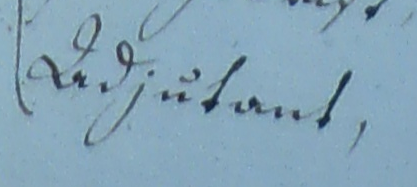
Adjutant,
